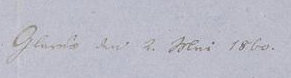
Glarus den 2. Mai 1860.
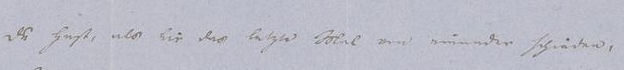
Du hast, als wir das letzte Mal von einander schieden,
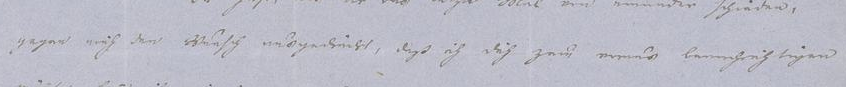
gegen mich den Wunsch ausgedrückt, daß ich Dich zum voraus benachrichtigen
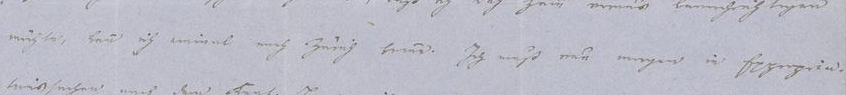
möchte, wenn ich einmal nach Zürich komme. Ich muß nun morgen in Expropria-
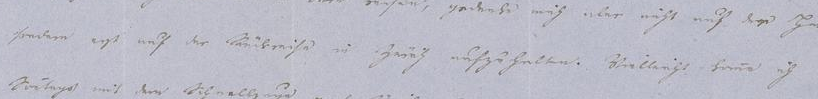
sondern erst auf der Rückreise in Zürich aufzuhalten. Vielleicht komme ich
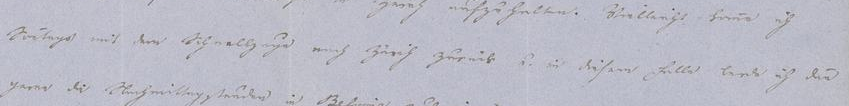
Sonntags mit dem Schnellzuge nach Zürich zurück u. in diesem Falle werde ich dann
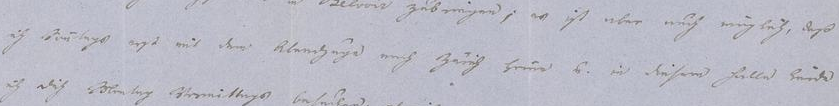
ich Sonntags erst mit dem Abendzuge nach Zürich komme u. in diesem Falle würde
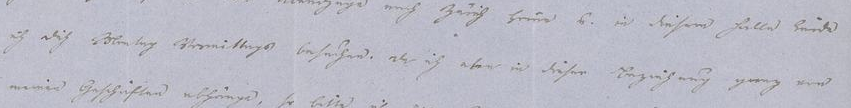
ich Dich Montag Vormittags besuchen. Da ich eben in dieser Beziehung ganz von
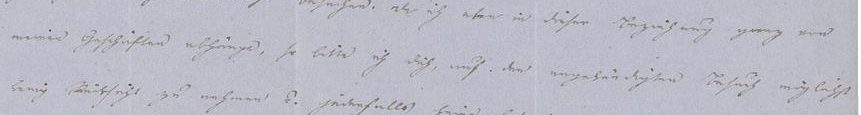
meinen Geschäften abhänge, so bitte ich Dich, auf den angekündigten Besuch möglichst
